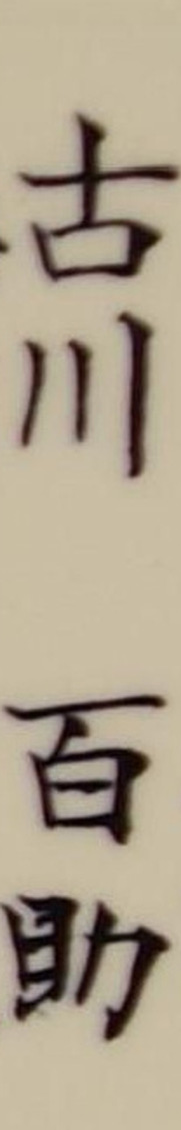古川百助
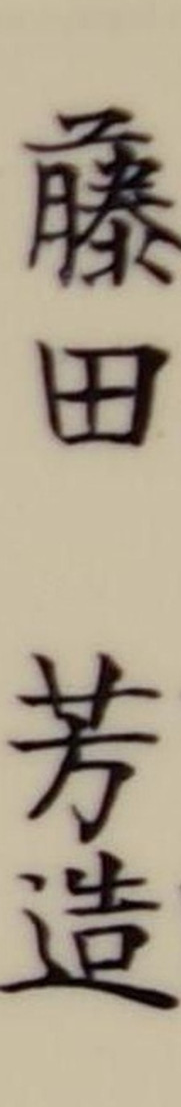藤田芳造
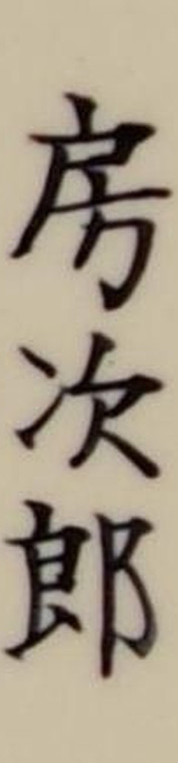房次郎
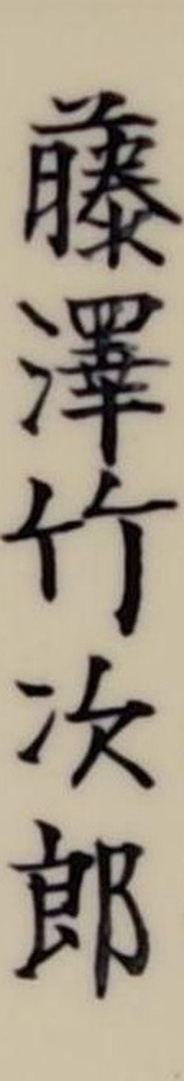藤澤竹次郎
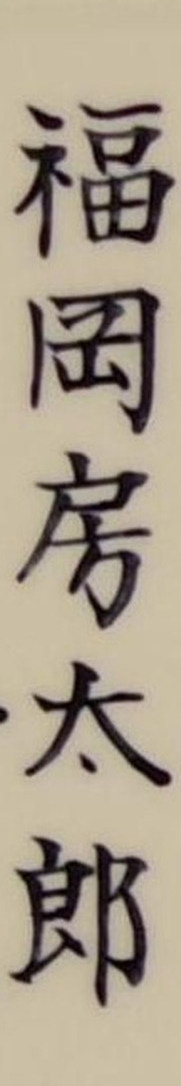福岡房太郎
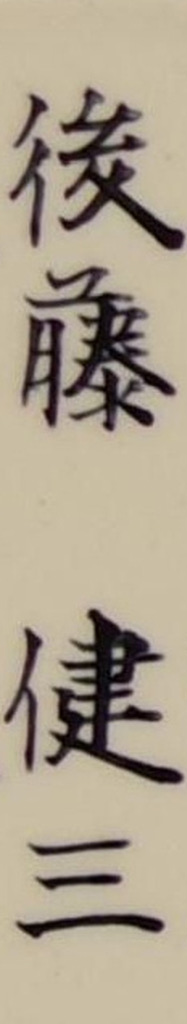後藤健三
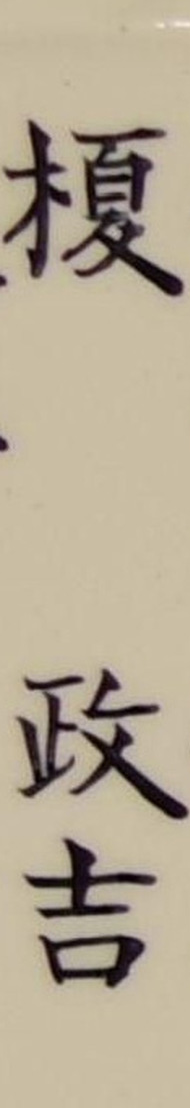榎政吉
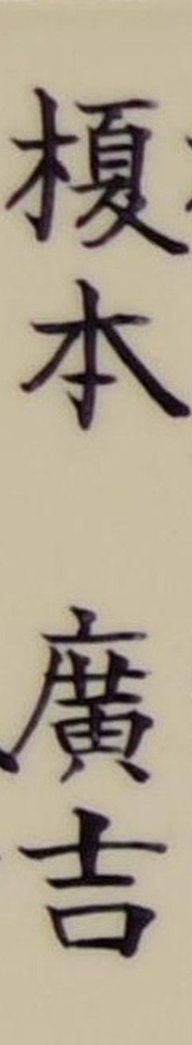榎本廣吉

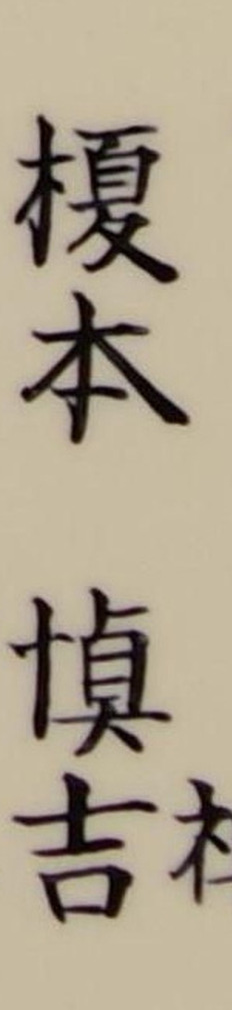榎本慎吉
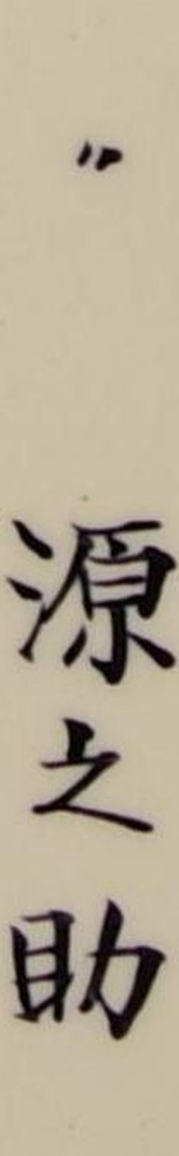源之助
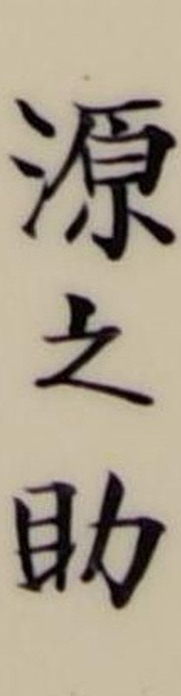源之助
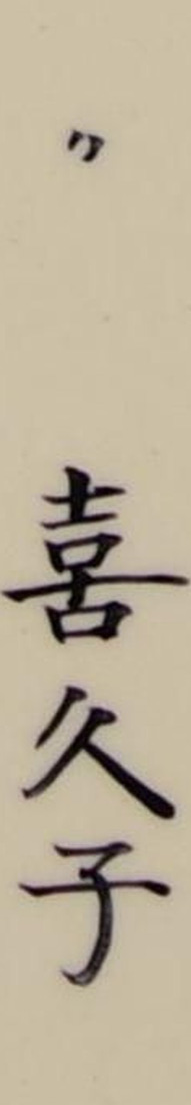喜久子
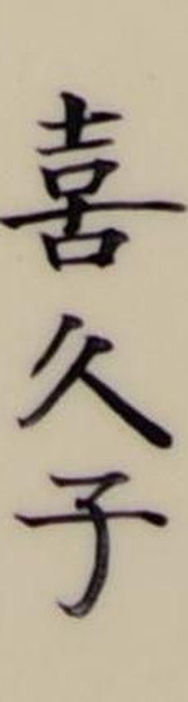喜久子
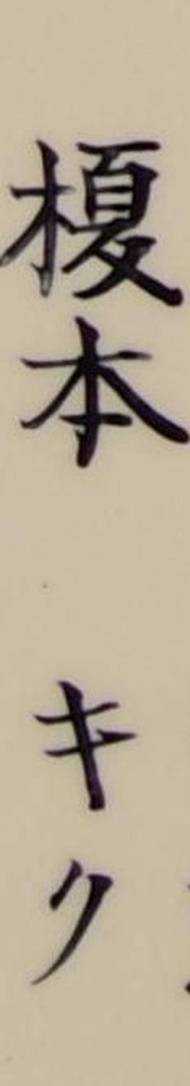榎本キク
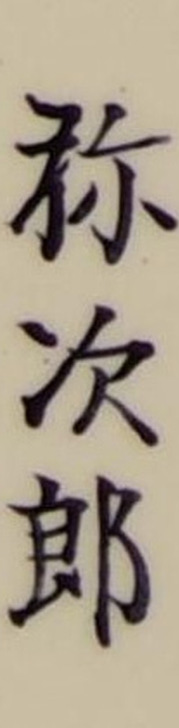称次郎
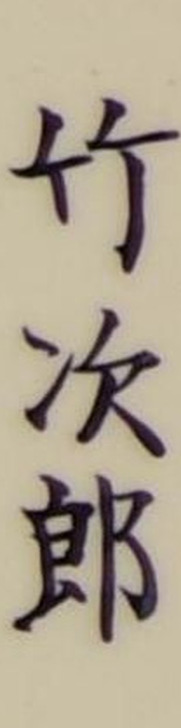竹次郎
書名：E~L
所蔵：高野山金剛峯寺
